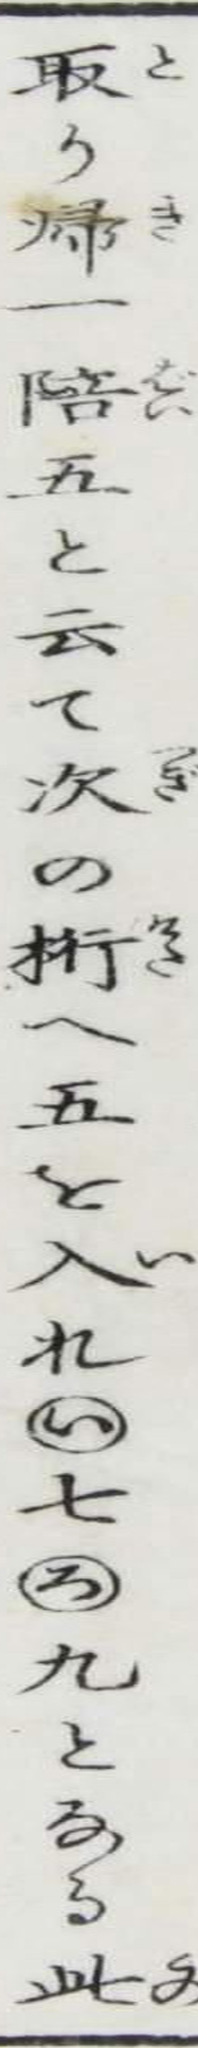取り帰一陪五と云て次の桁へ五を入れ㋑七㋺九となる此
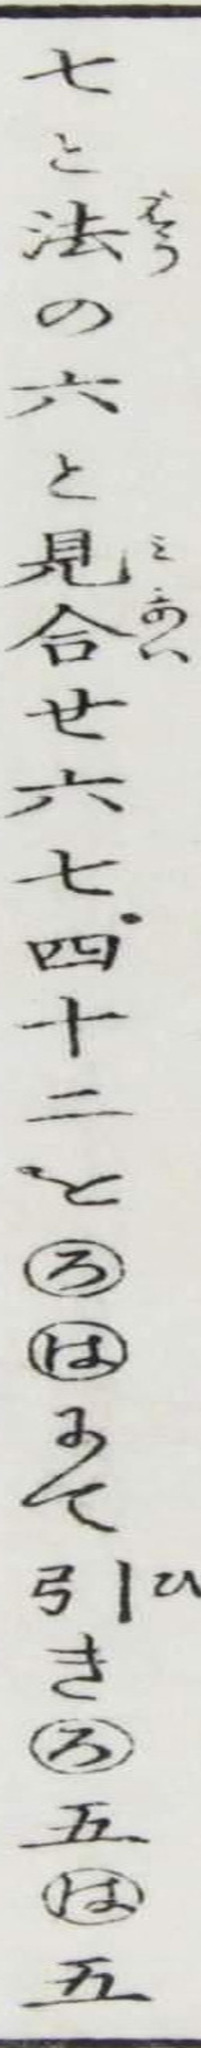七と法の六と見合せ六七．四十二を㋺㋩にて引き㋺五㋩五
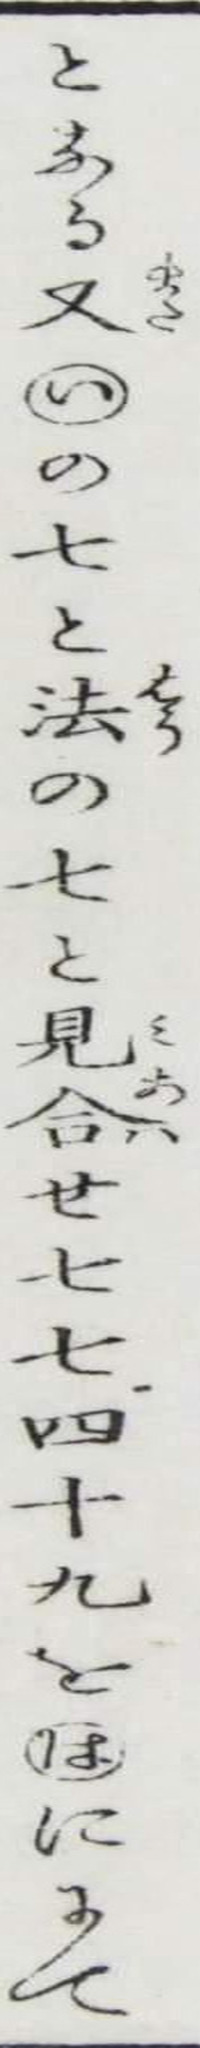となる又㋑の七と法の七と見合せ七七．四十九を㋩ににて
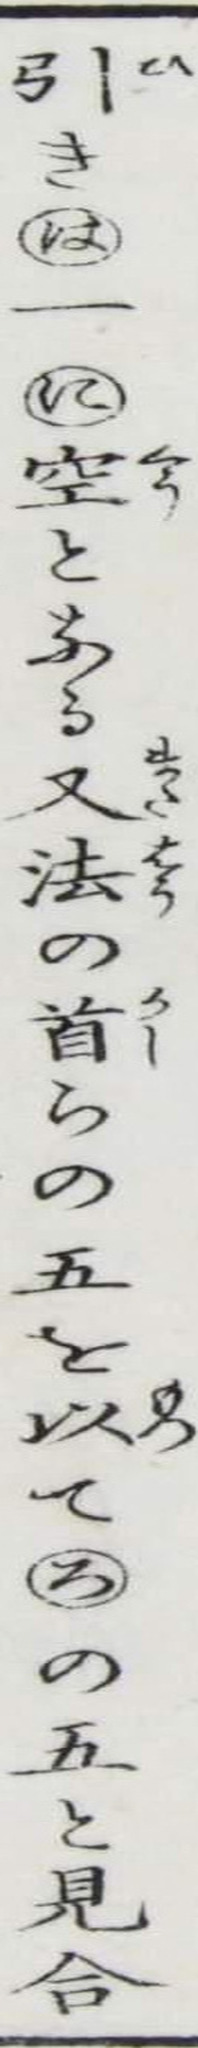引き㋩一㋥空となる又法の首らの五を以て㋺の五と見合
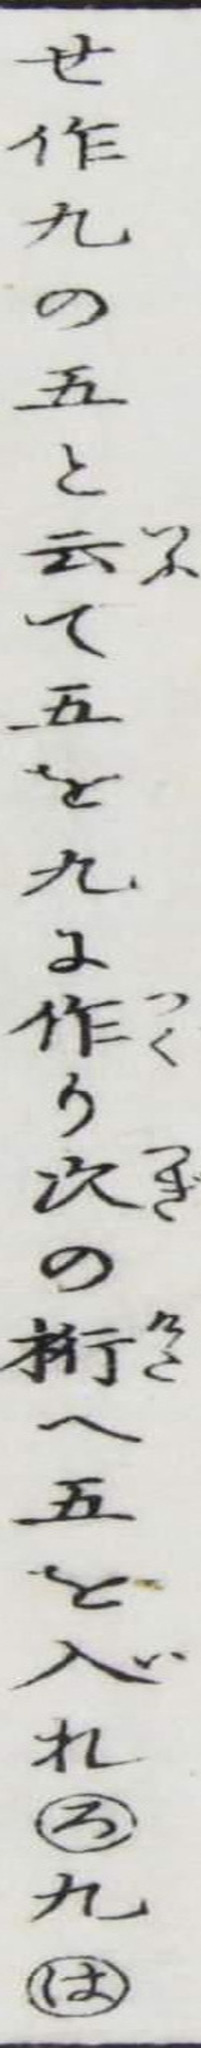せ作九の五と云て五を九に作り次の桁へ五を入れ㋺九㋩
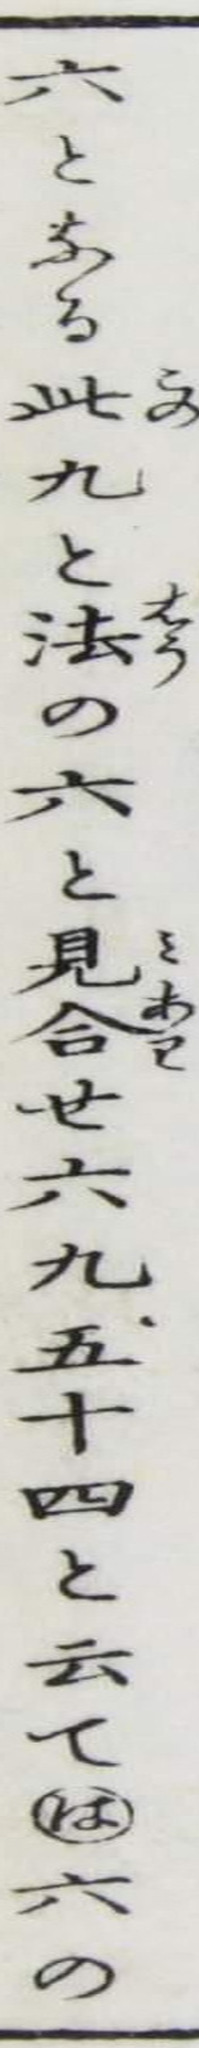六となる此九と法の六と見合せ六九．五十四と云て㋩六の
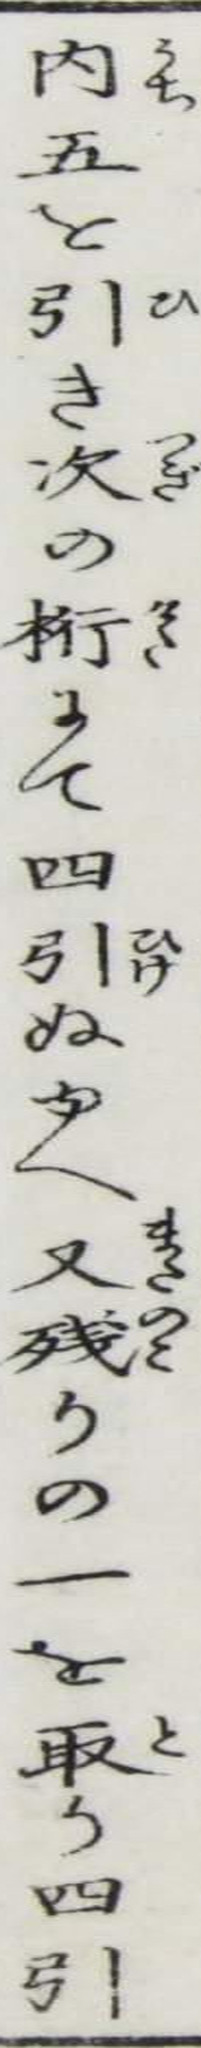内五を引き次の桁にて四引ぬゆへ又残りの一を取り四引
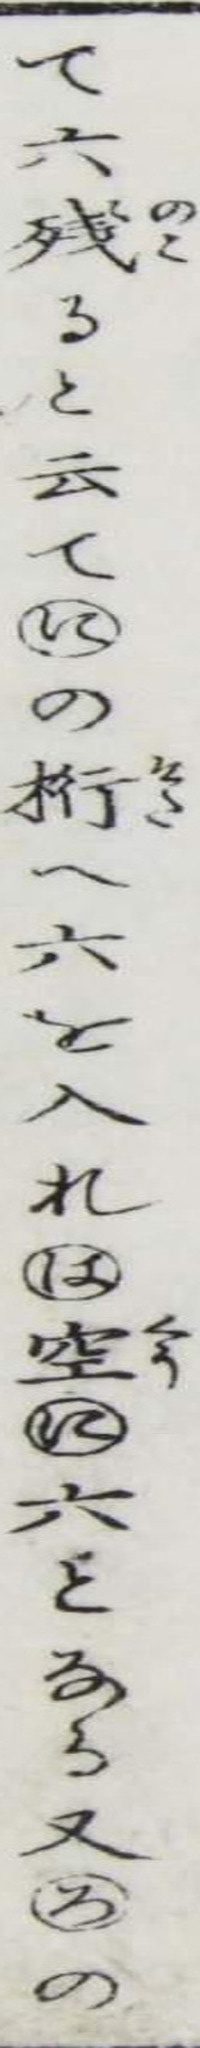て六残ると云て㋥の桁へ六を入れ㋩空㋥六となる又㋺の
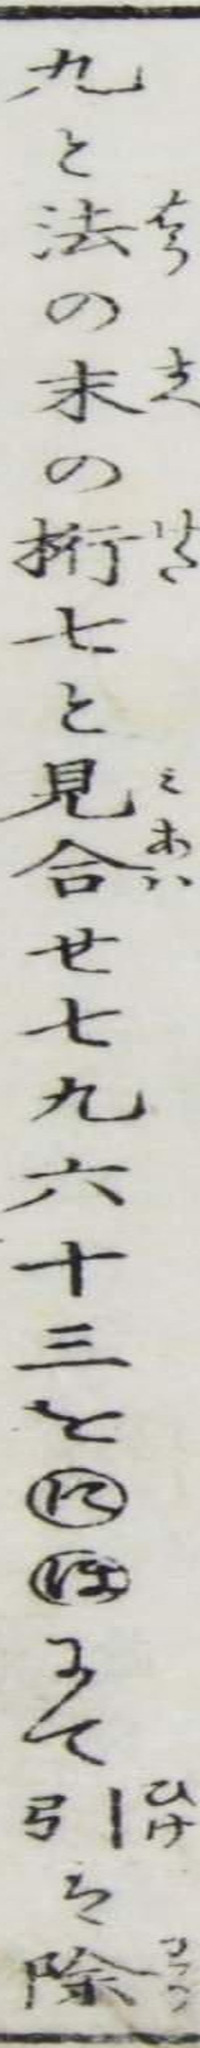九と法の末の桁七と見合せ七九六十三を㋥㋭にて引は除
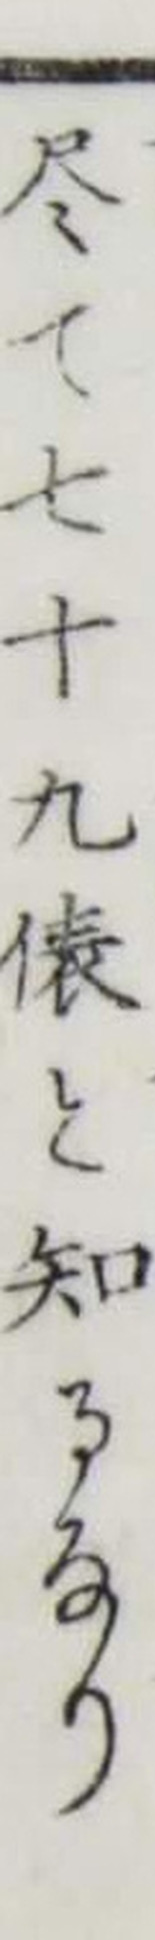尽て七十九俵と知るなり

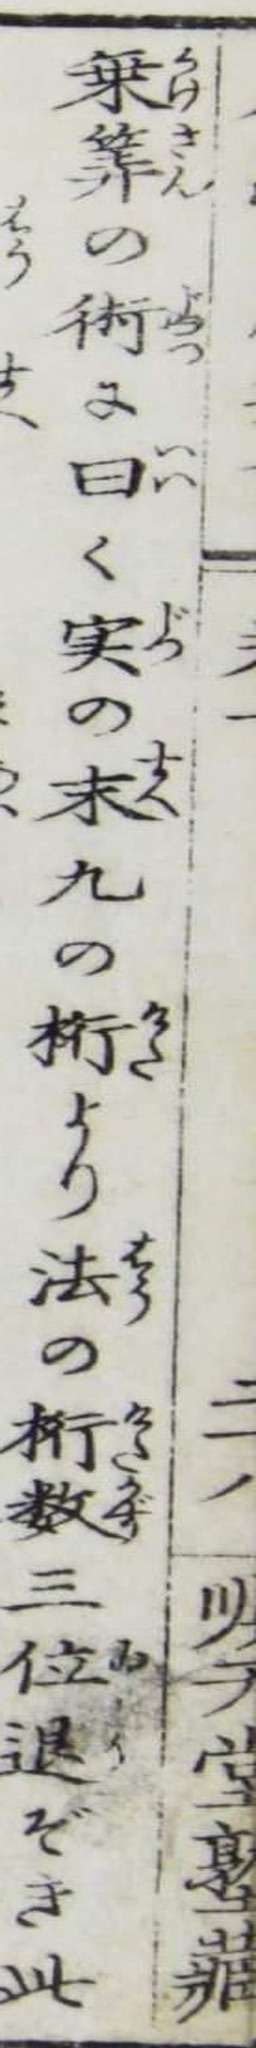乗算の術に曰く実の末九の桁より法の桁数三位退ぞき此
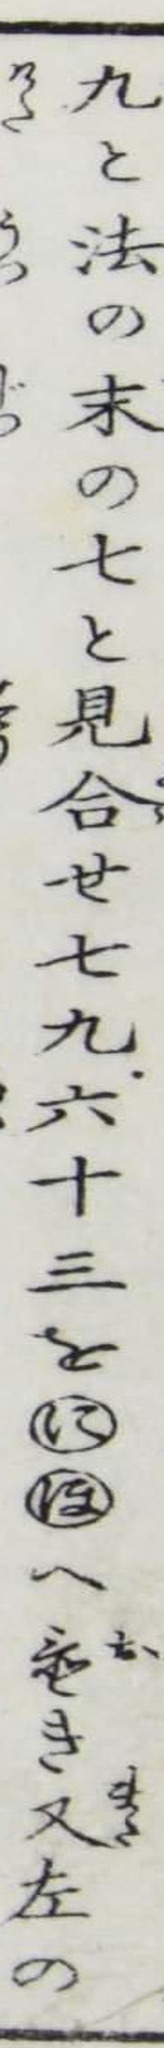九と法の末の七と見合せ七九．六十三を㋥㋭へ置き又左の
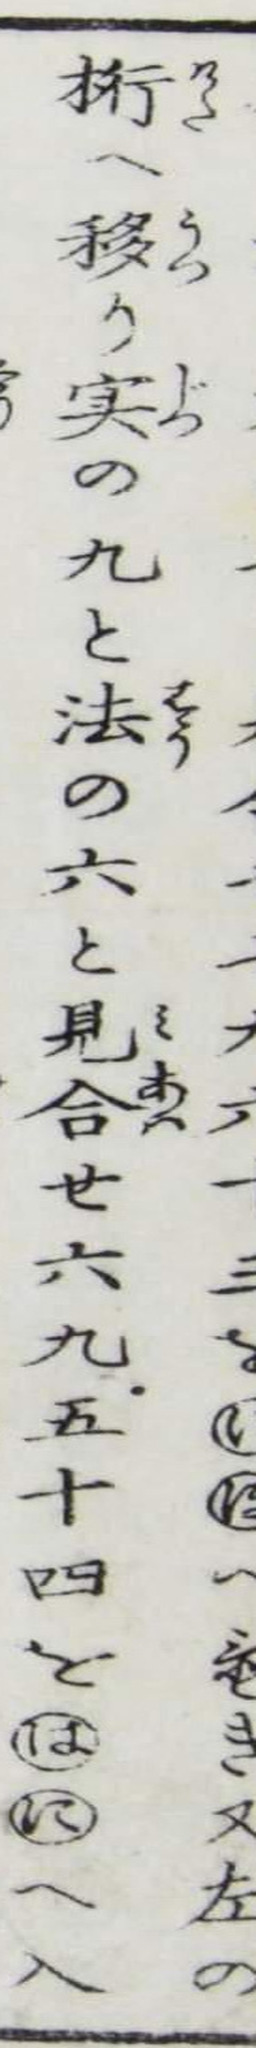桁へ移り実の九と法の六と見合せ六九．五四を㋩㋥へ入
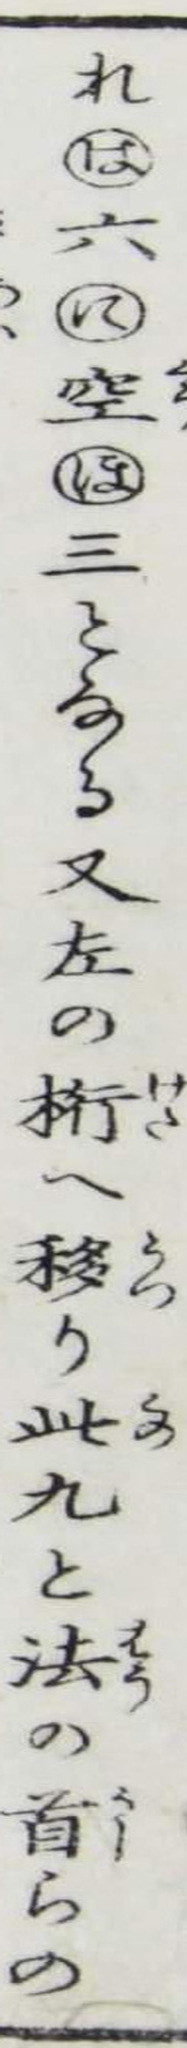れ㋩六㋥空㋭三となる又左の桁へ移り此九と法の首らの
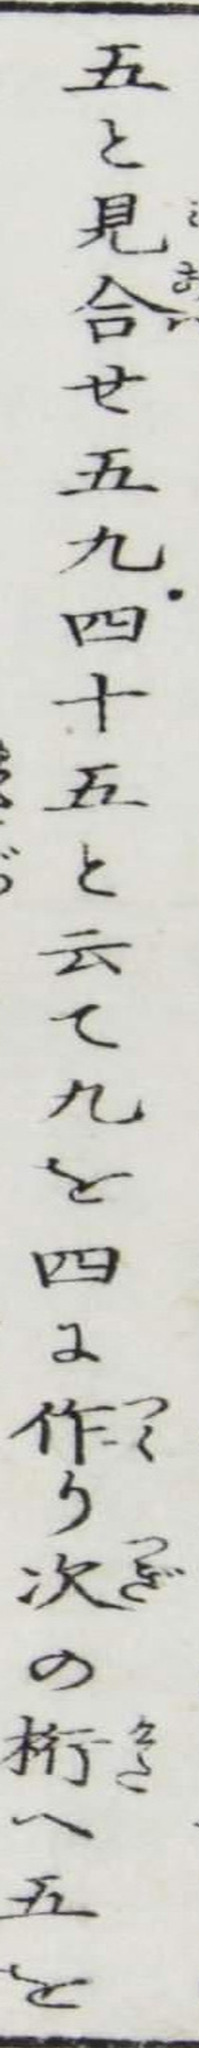五と見合せ五九．四十五と云て九を四に作り次の桁へ五を
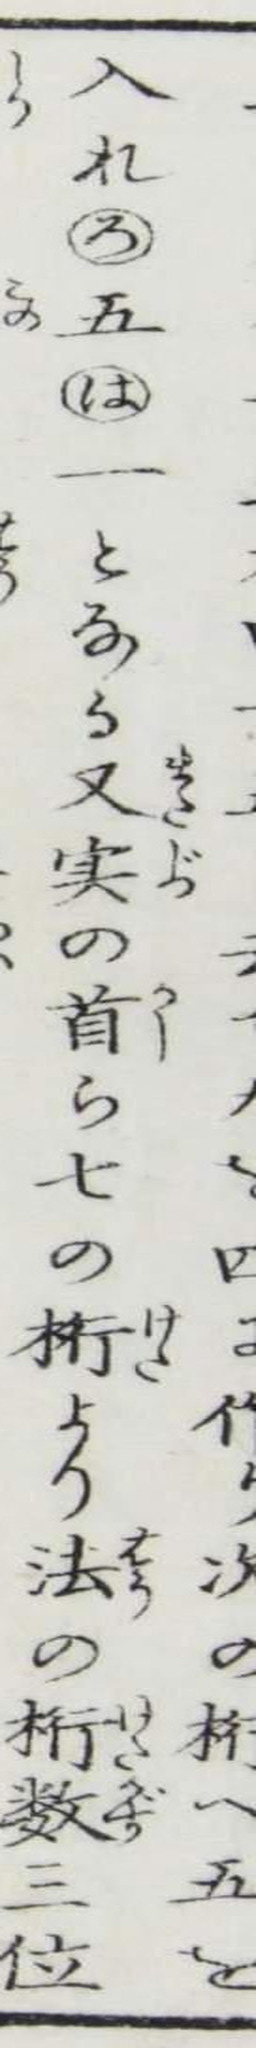入れ㋺五㋩一となる又実の首ら七の桁より法の桁数三位
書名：明治小學塵劫記 卷1
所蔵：東京学芸大学教育コンテンツアーカイブ
